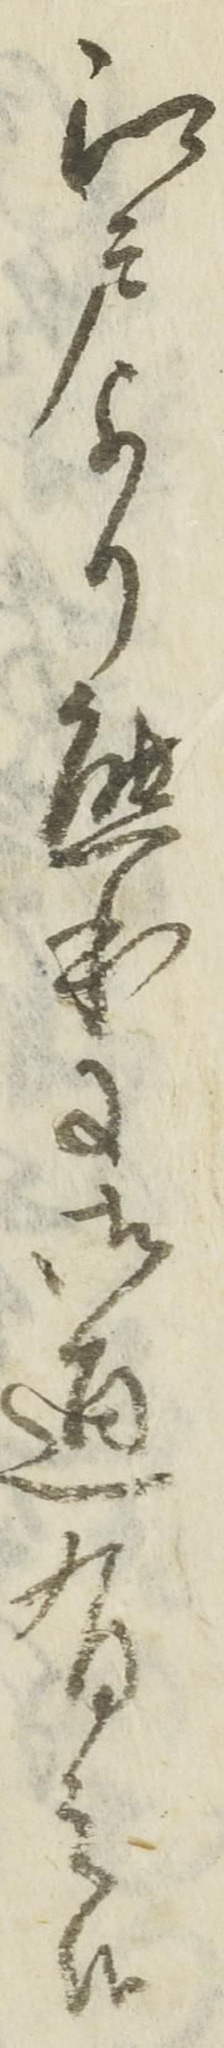江戸より熊本に御通有之候
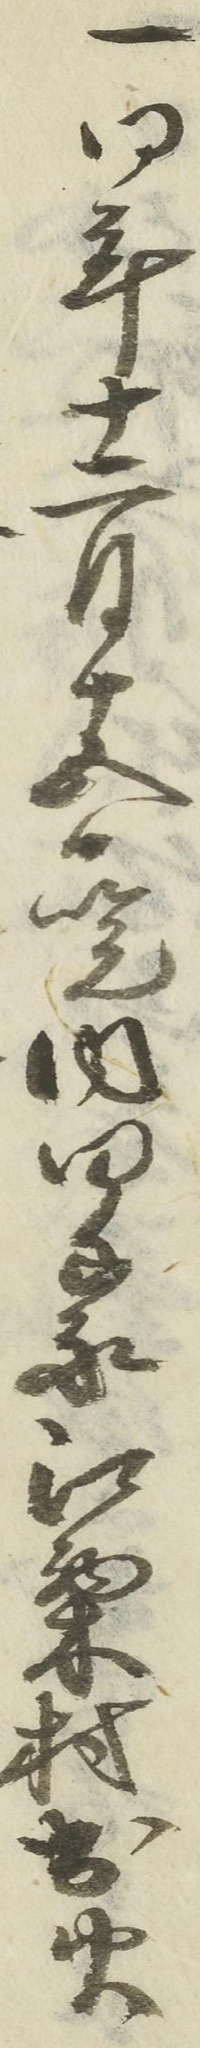一同年十二月十五日晩内田手永江栗村出火
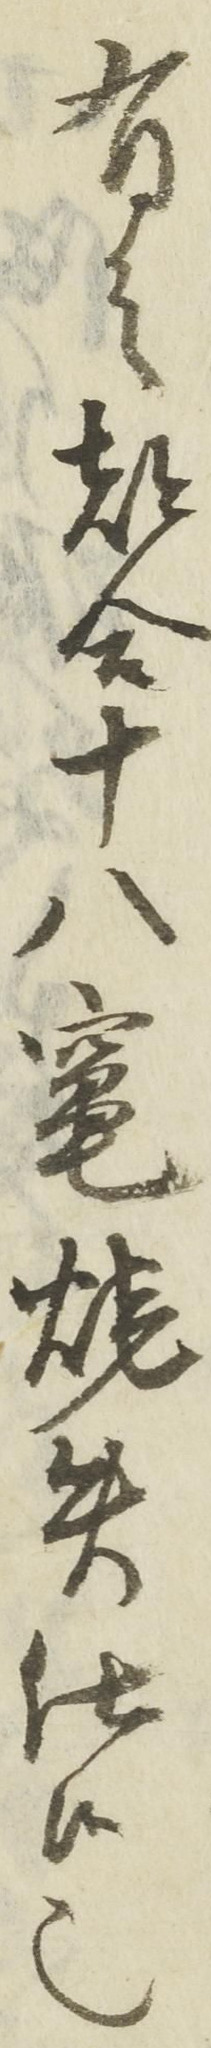有之都合十八竈焼失仕候也
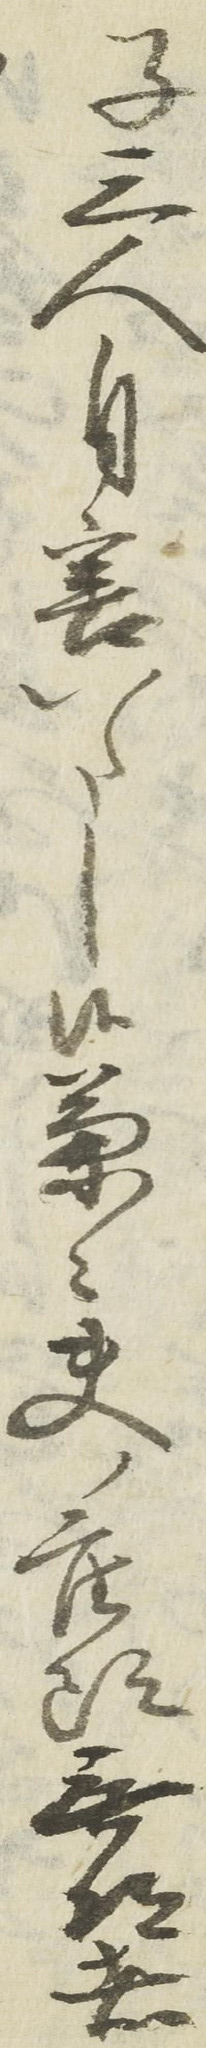子三人自害いたし候兼々夫ノ座頭無道者
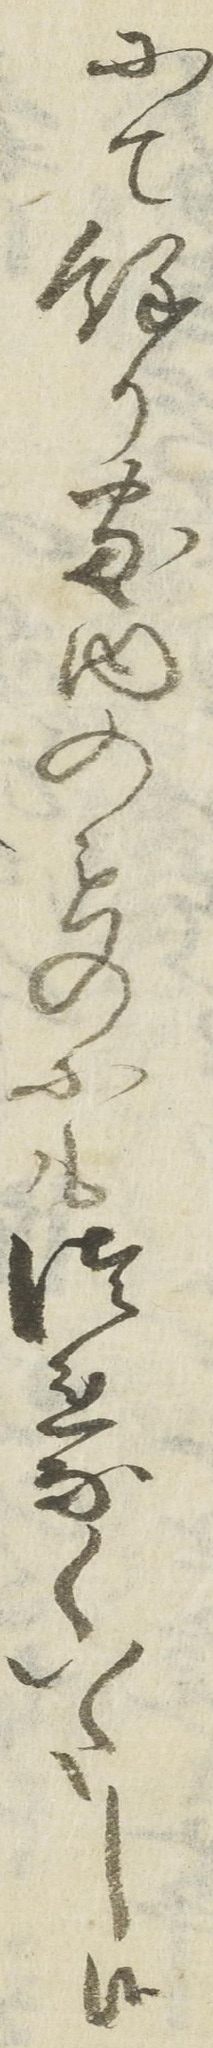にて余り家内のものにも御近なくいたし候
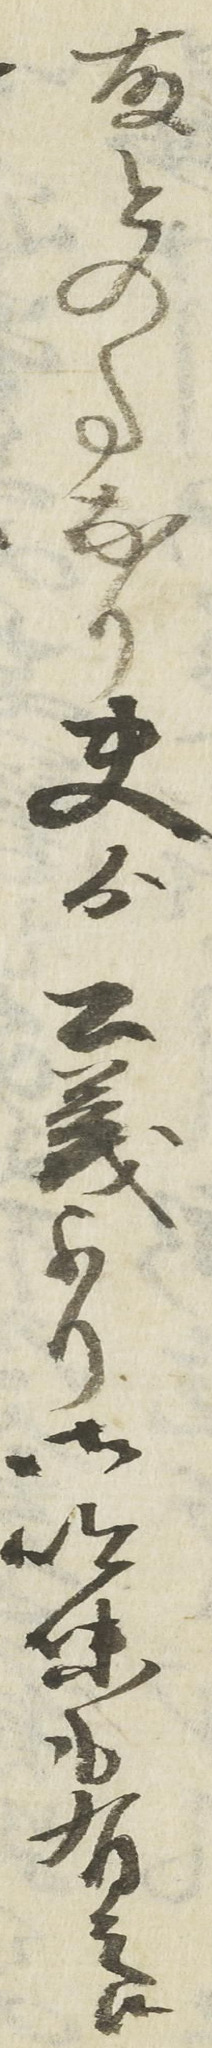故との事なり夫ゟ公義より御吟味も有之候
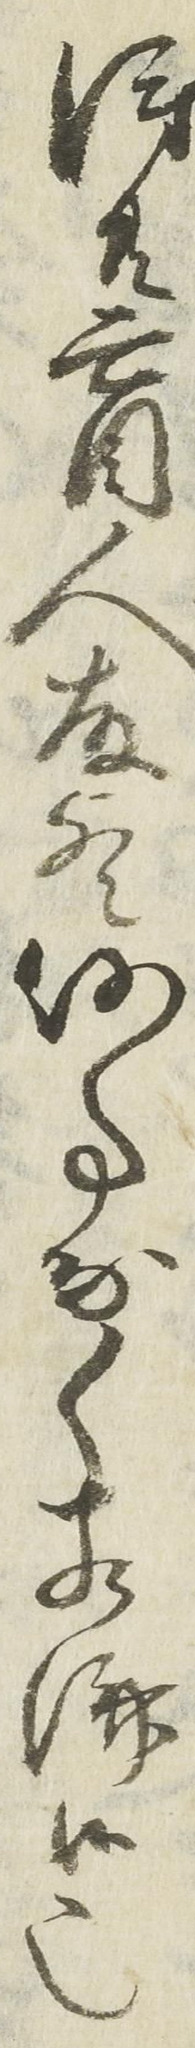得共盲人故歟何事なく相済候也
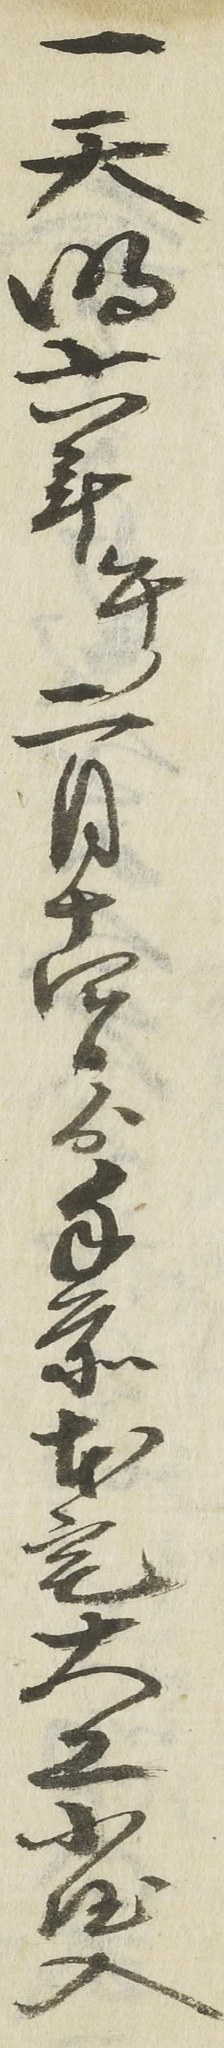一天明六年午ノ二月十四日ゟ手前本宅大工小屋入
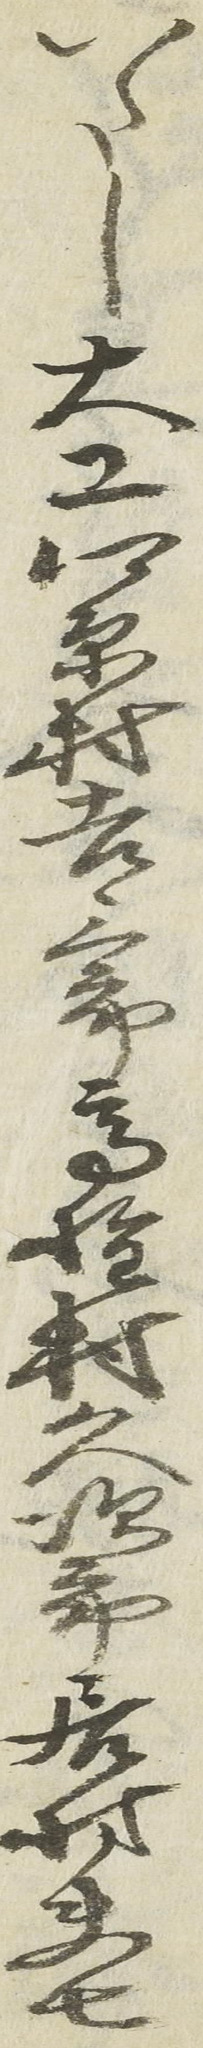いたし大工郷原村吉三郎高椎村久次郎居村夫七
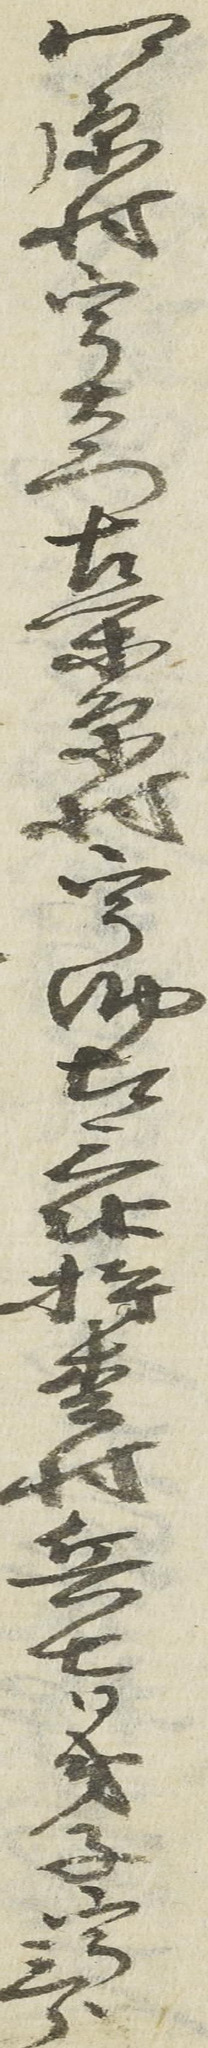郷原村宇右衛門古閑原村宇助右三次持枩村兵七同弟子宇三郎
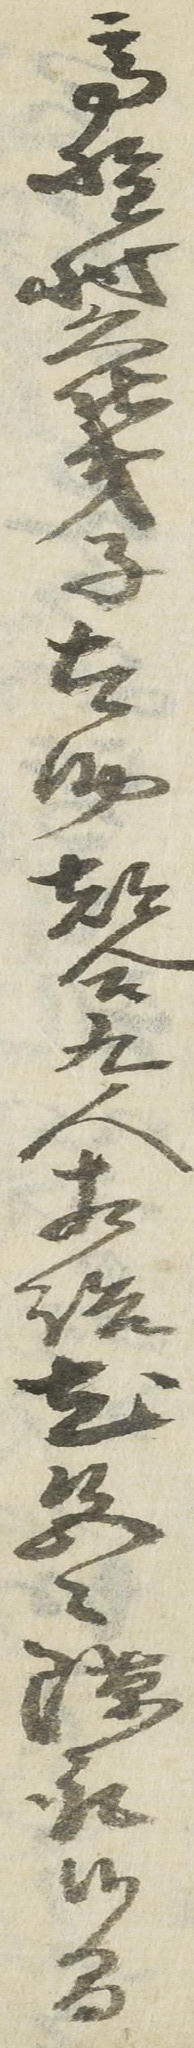高野村久次弟子太助都合九人相詰尤色々隙取候間
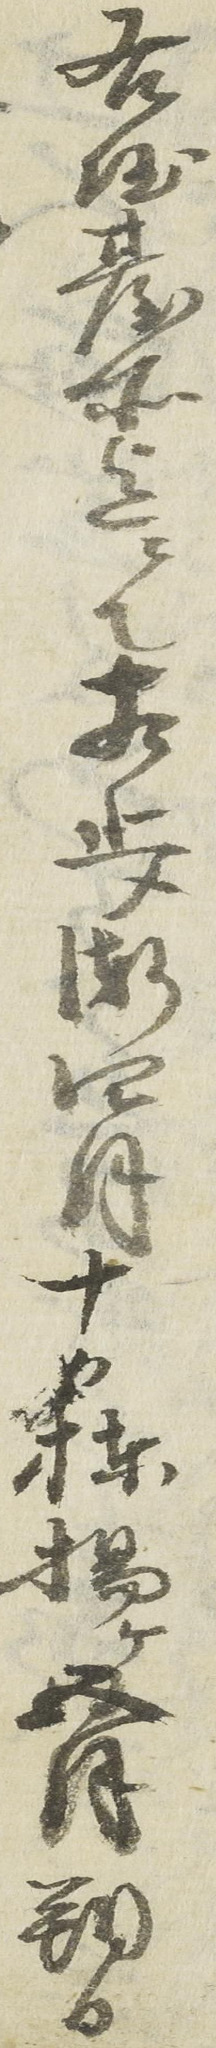居屋台所迄ニて相止メ漸四月十日棟揚ケ五月朔日
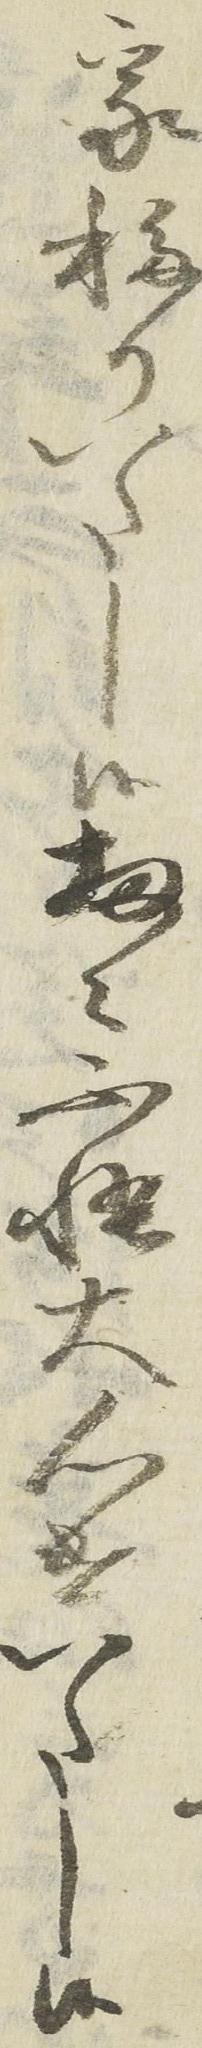家移りいたし候扨々不快大心遣いたし候

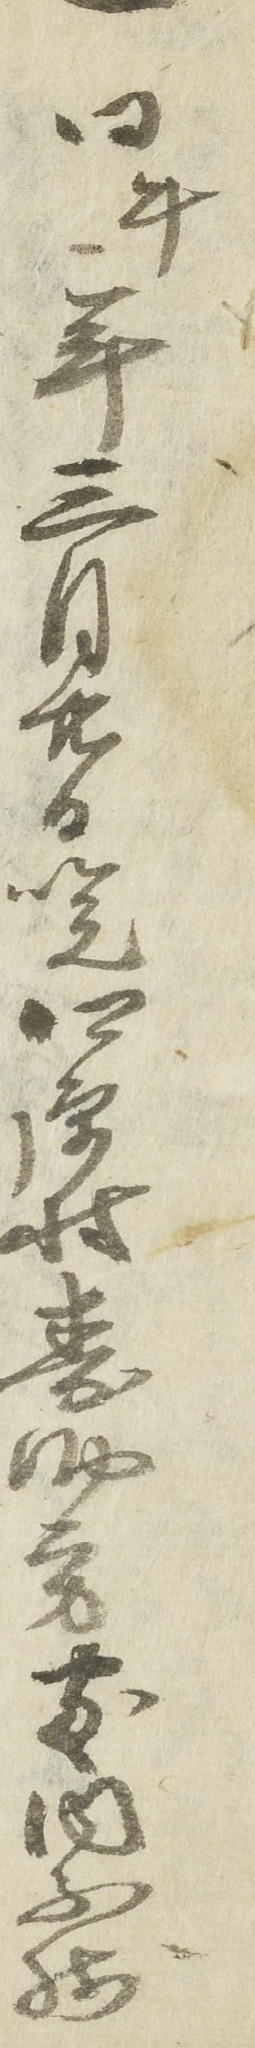一同午年三月廿日晩郷原村寿助方家内不残
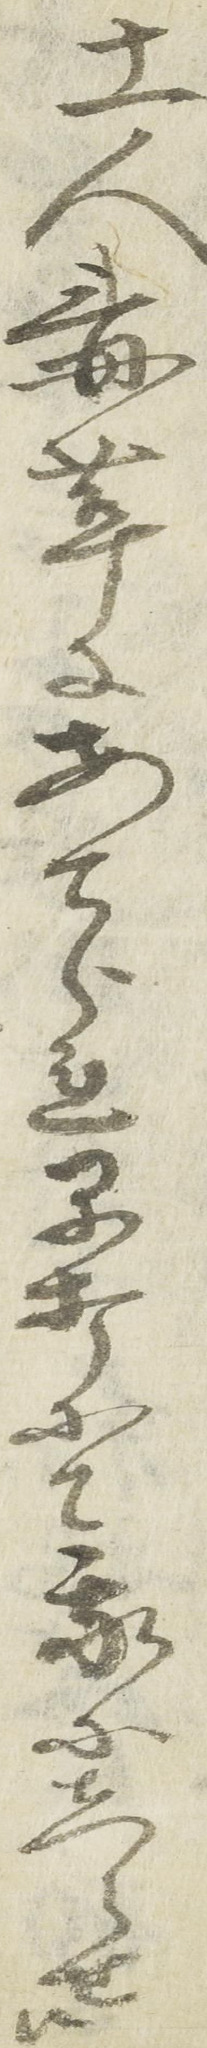十一人毒草にあたられ早打にて我にしらせ候
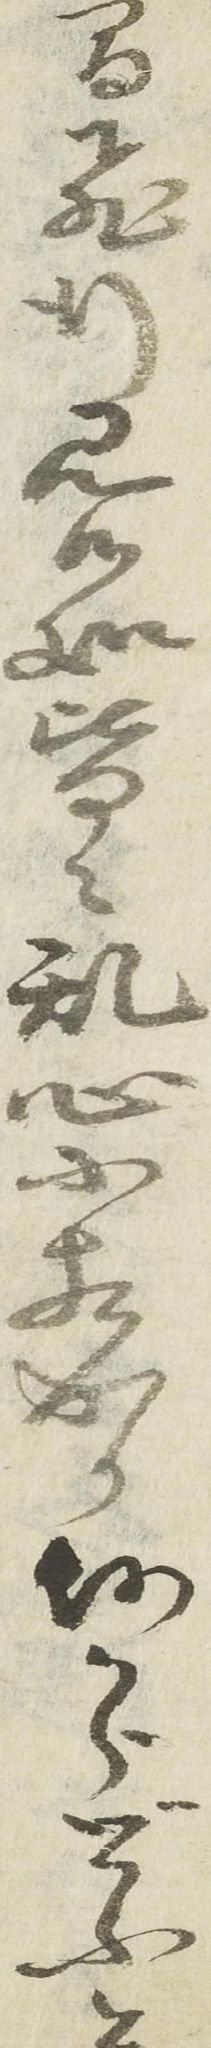間飛行見候処皆〻乱心に相成り何からどふと
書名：後見笑
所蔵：東京大学地震研究所図書室 Earthquake Research Institute Library, The University of Tokyo, JAPAN
